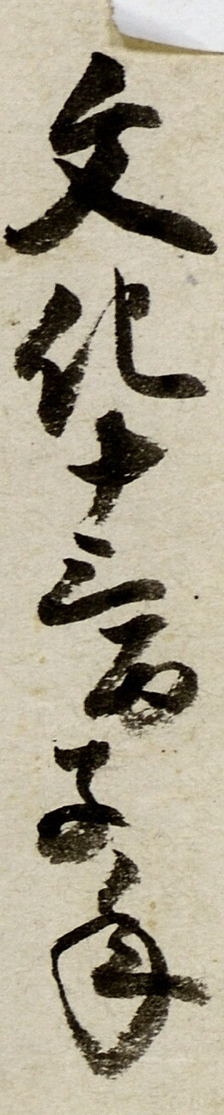文化十三丙子年
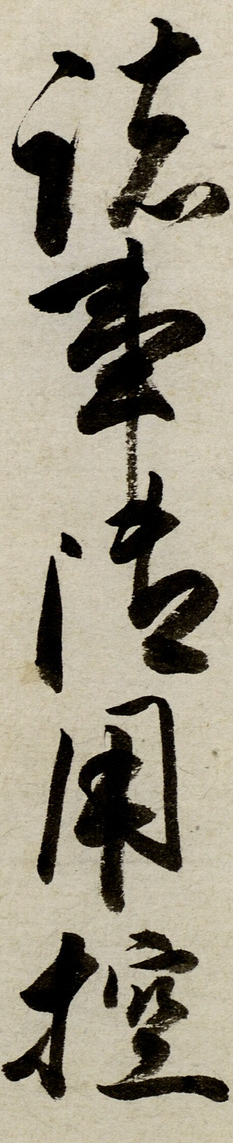諸事御用控
